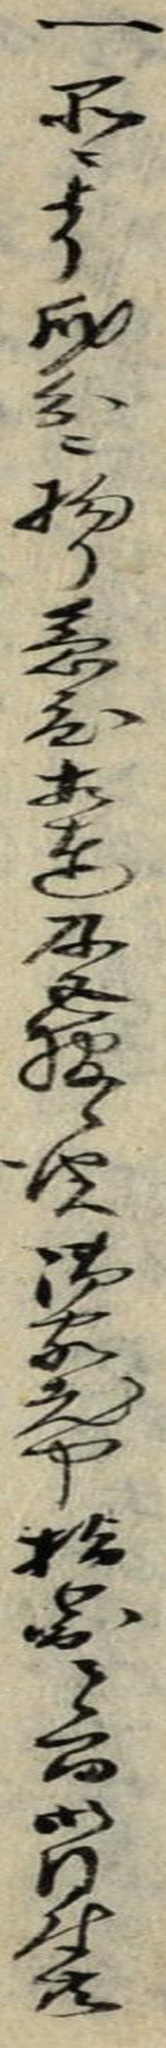一品により身分に拘り急度相達及返報候儀は御家老中指図に候間御目付共
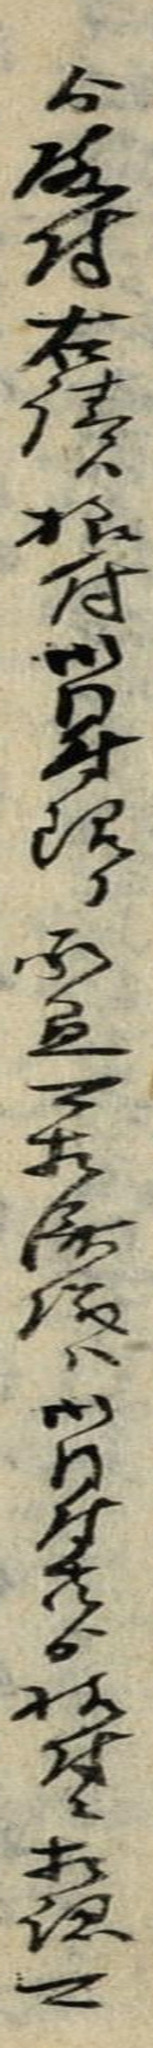ゟ殿付右請は様付御目付限り承置可相済儀は御目付共ゟ様付に相認可
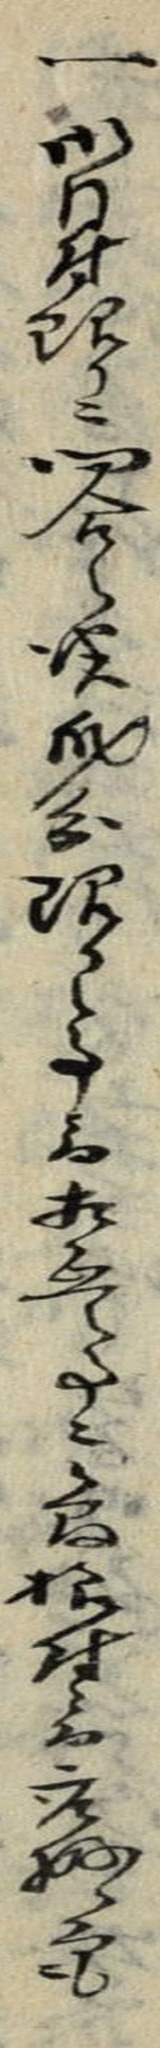一御目付限りに問合之儀は身分限り之事に而相互之事に候間様付に而取扱候而も
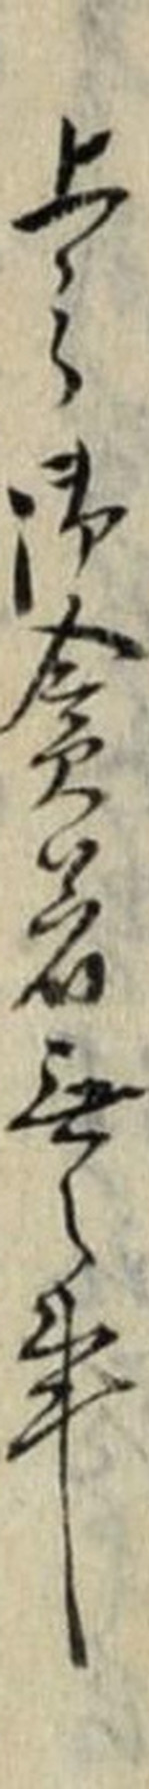上々之御貪着無之事
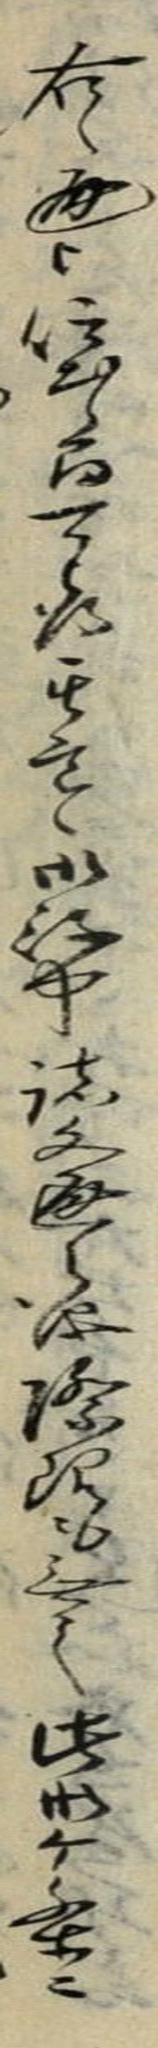右之通被仰出候間可被得其意候御役中諸文通之儀際限も無之此御ヶ条に
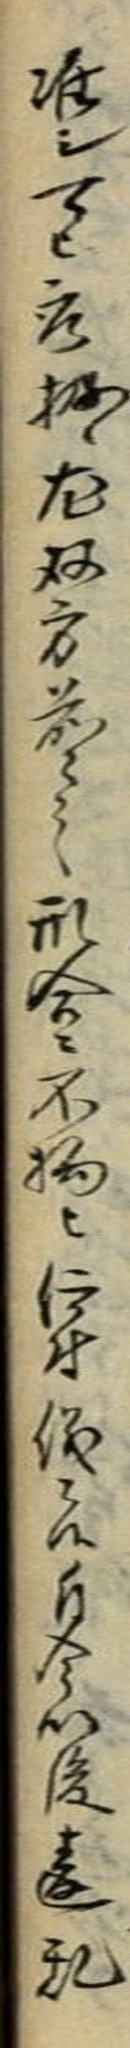准し可被取扱候尤双方前々之都合に不拘被仰付儀に候自今以後違乱
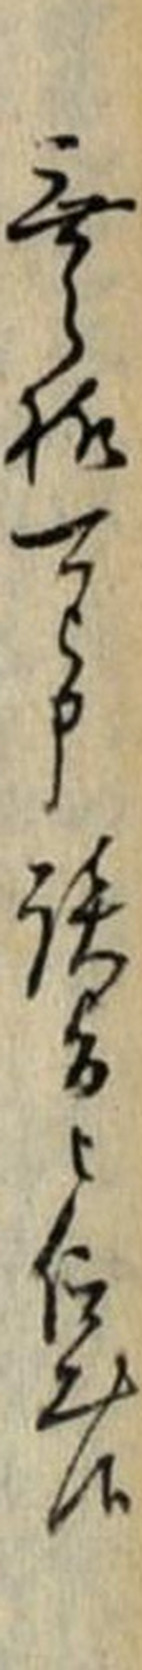無之様可被申談旨被仰出候
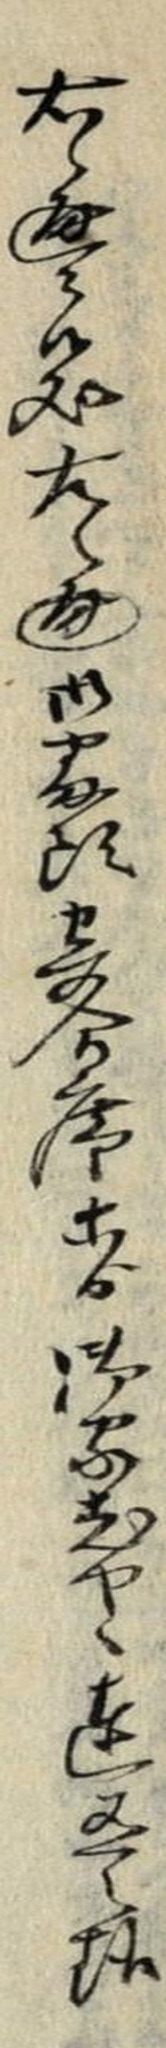右之通に候処左之通御番頭寄合席等ゟ御家老中へ達有之趣
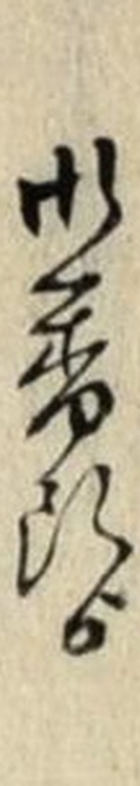御番頭ゟ
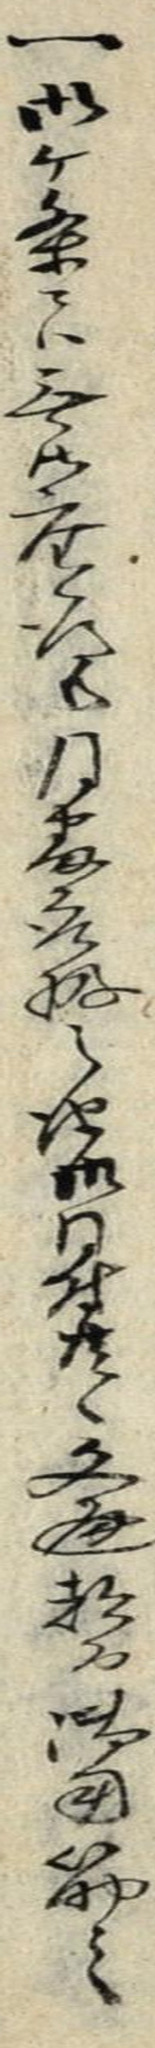一御ヶ条には無御座候得共月番取扱之儀御目付共へ文通都而御用筋之
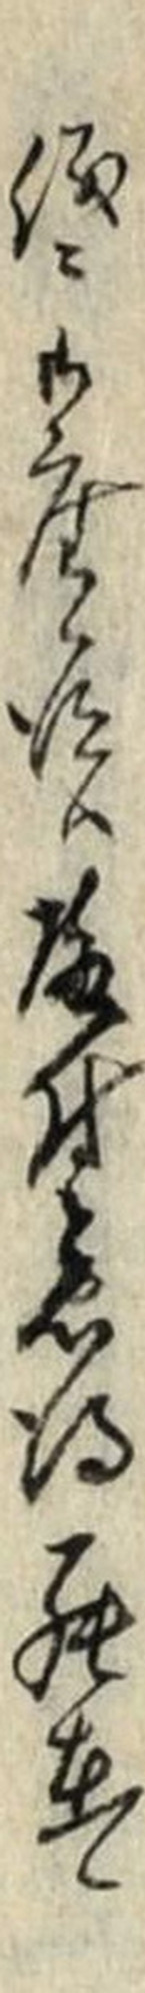儀に御座候得は殿付と心得罷在候
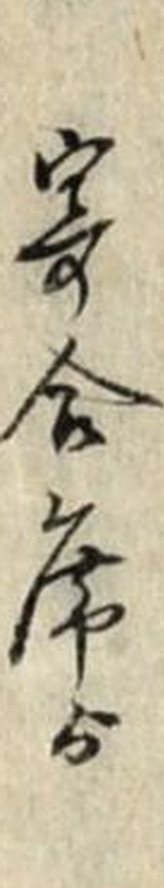寄合席ゟ
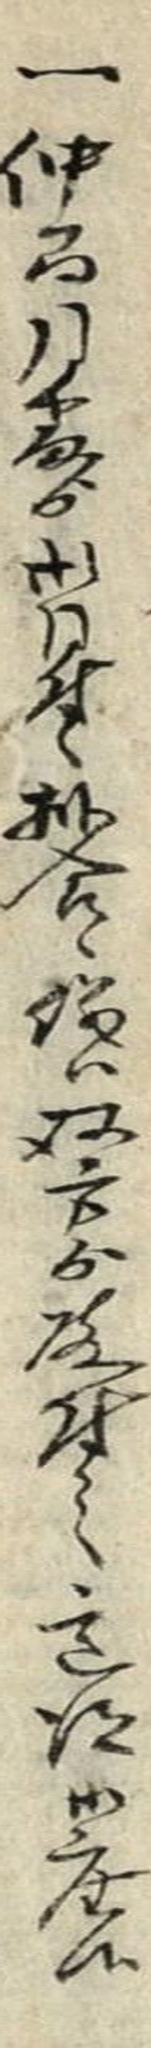一仲間月番ゟ御目付へ掛合候儀は双方ゟ殿付之意得御座候
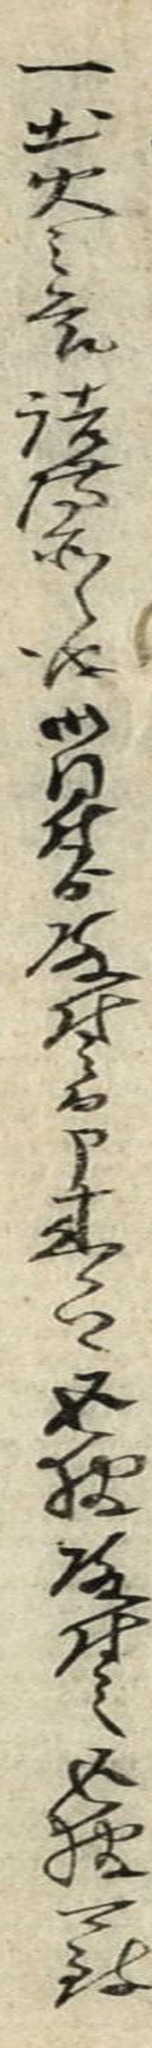一出火之節詰場所之儀御目付ゟ殿付に而申来候はゝ返報殿付之返報可致
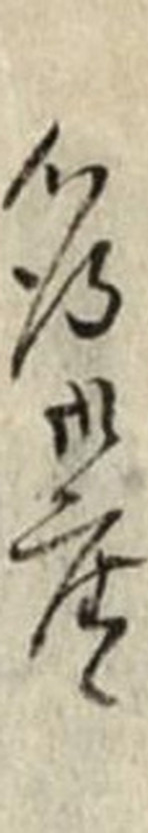心得御座候
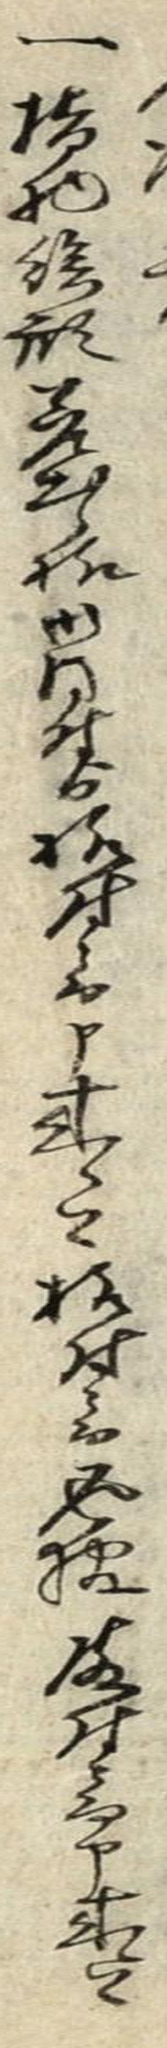一指物絵形差出候様御目付ゟ様付に而申来候はゝ様付に而返報殿付に而申来候はゝ
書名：蒐輯之部
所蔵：福井県文書館 Fukui Prefectural Archives
